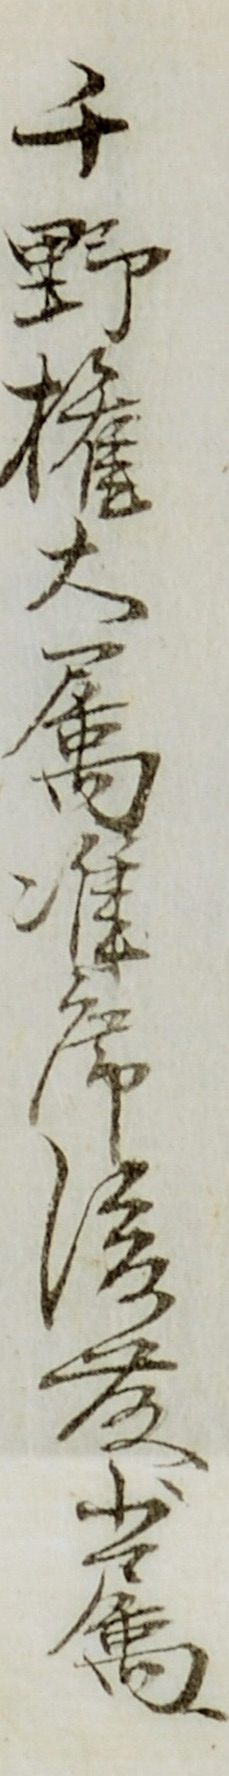千野権大属准席後藤少属へ
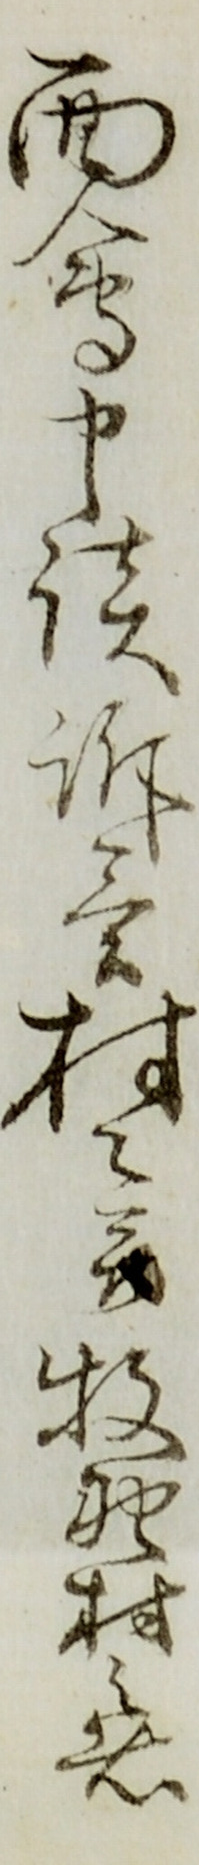面会申談訴答村々幷牧野村之者
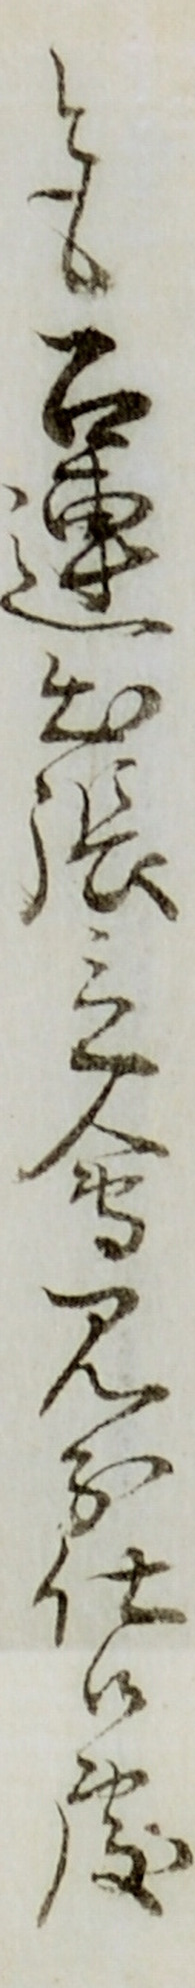とも召連出張立会見分仕候処
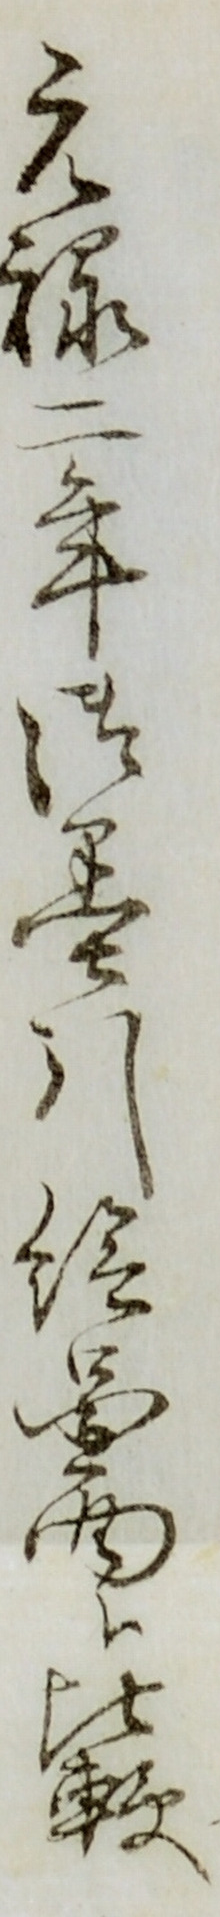元禄二年御墨引絵図面え比較
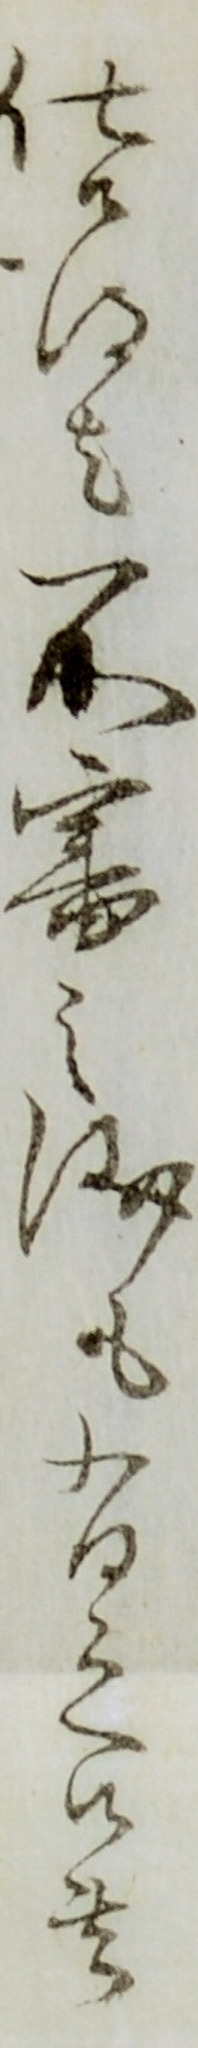仕候得は不審之儀も有之候共
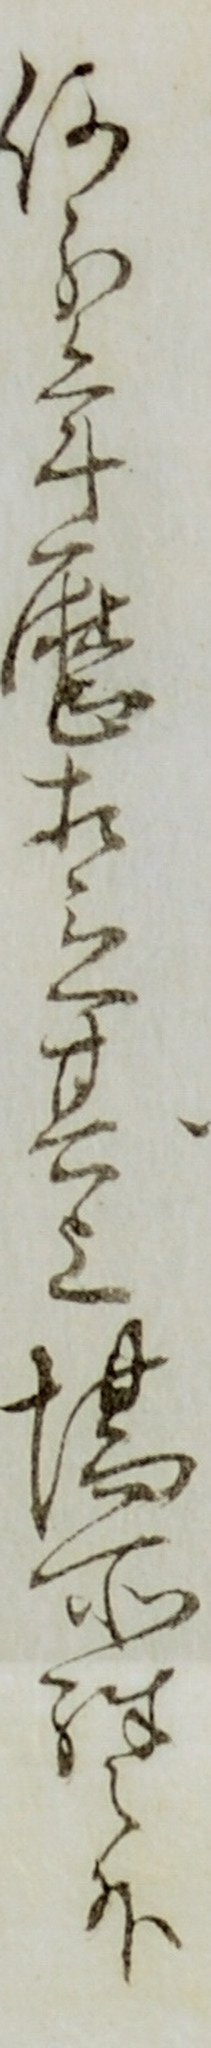何分年歴相立其上場所殊之外
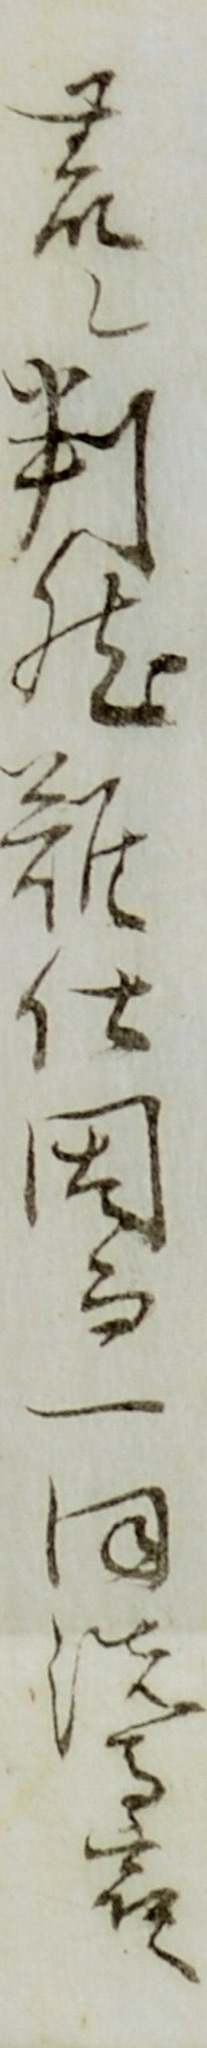荒レ判然難仕因て一同洗馬宿へ

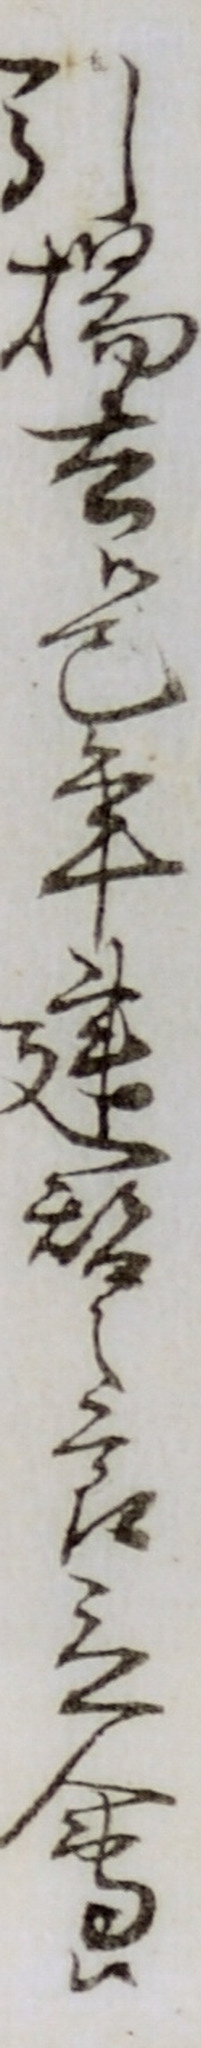引揚去ル巳年建替之節立会候
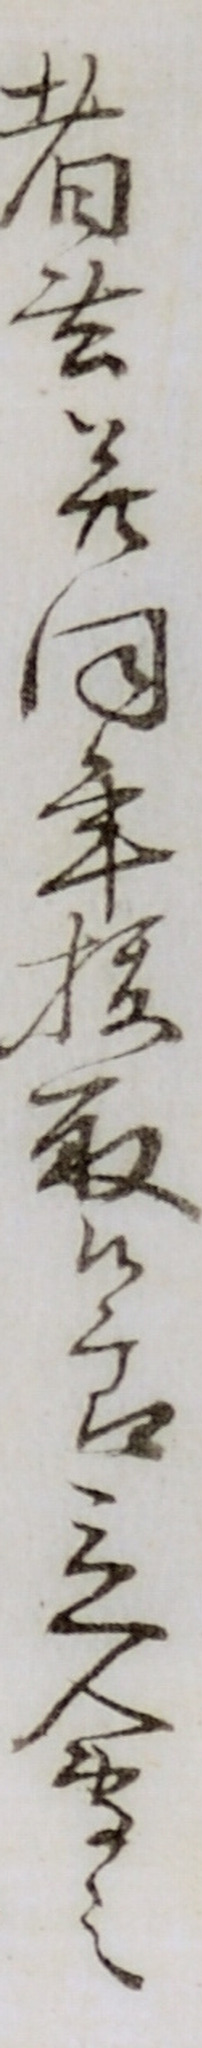者共幷同年抜取候節立会之
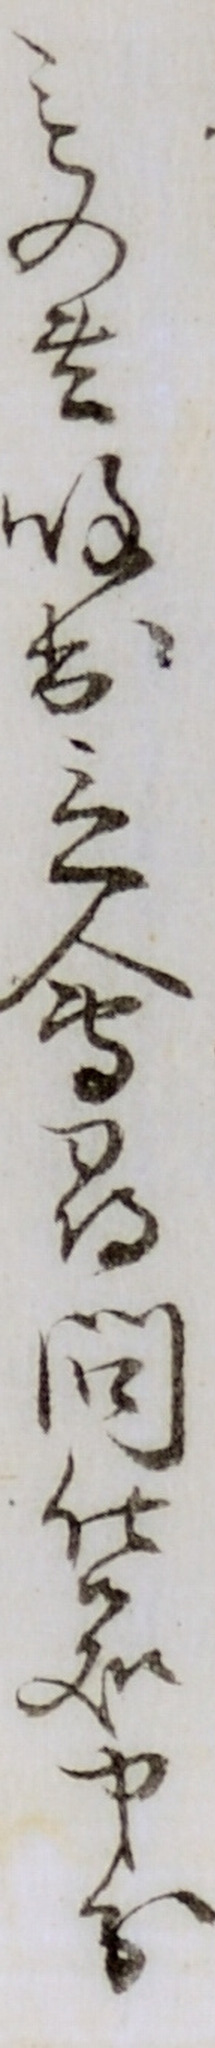もの共呼出立会尋問仕候処申分
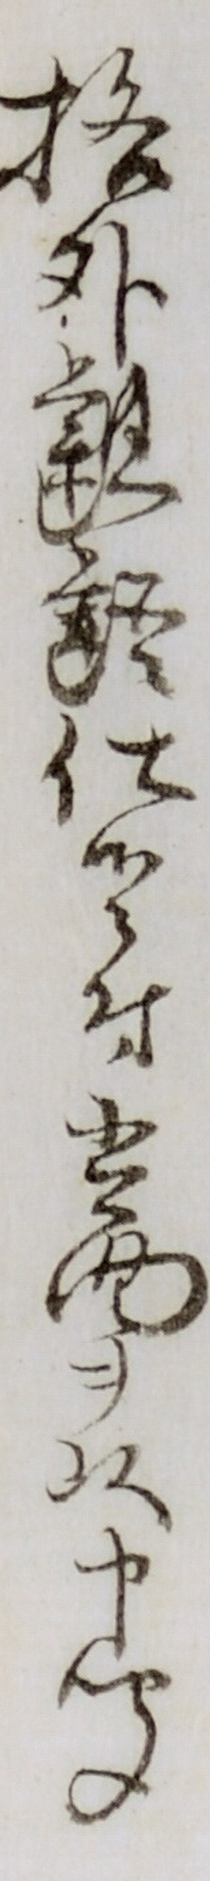格外齟齬仕候に付書面を以申聞
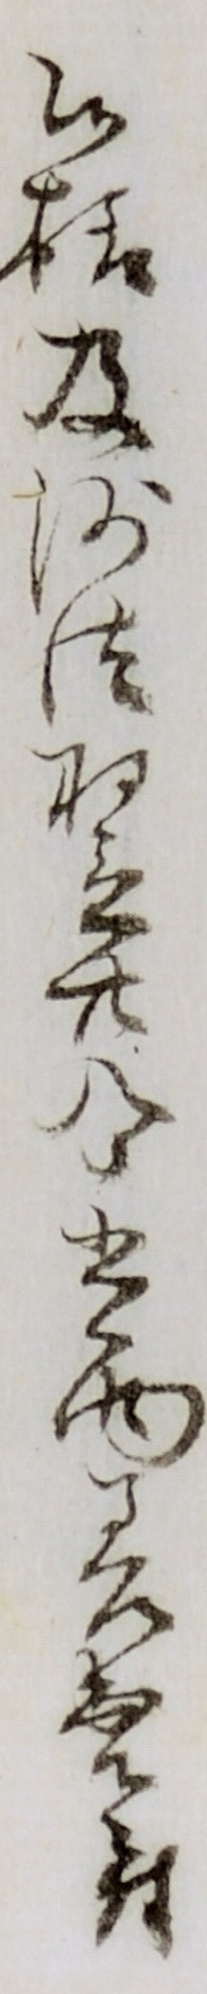候様及沙汰翌廿八日書面差出候に付
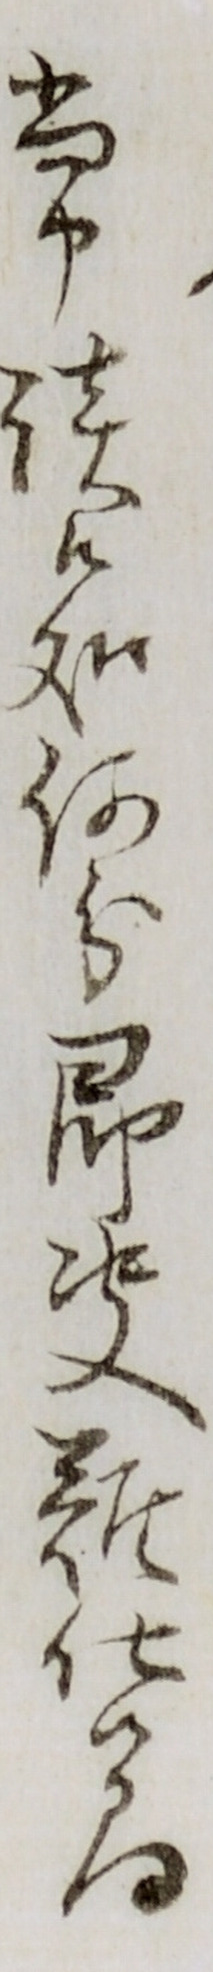尚申談候処何分即決難仕候間
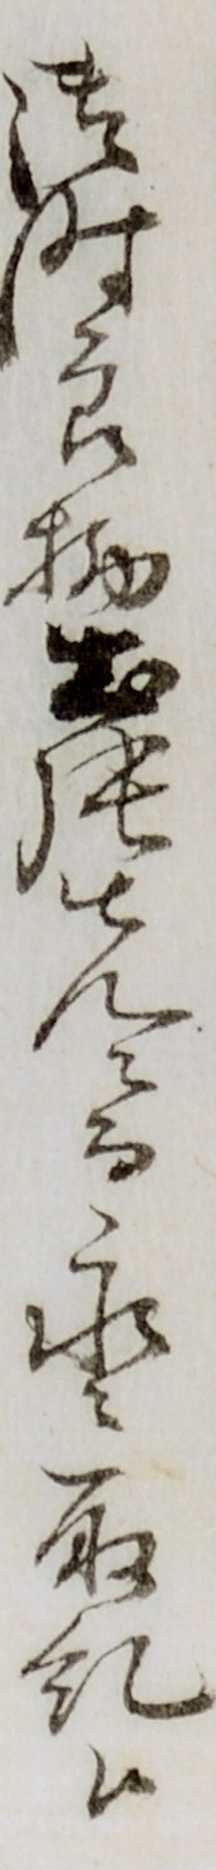御時節柄出張先にて永々取糺候
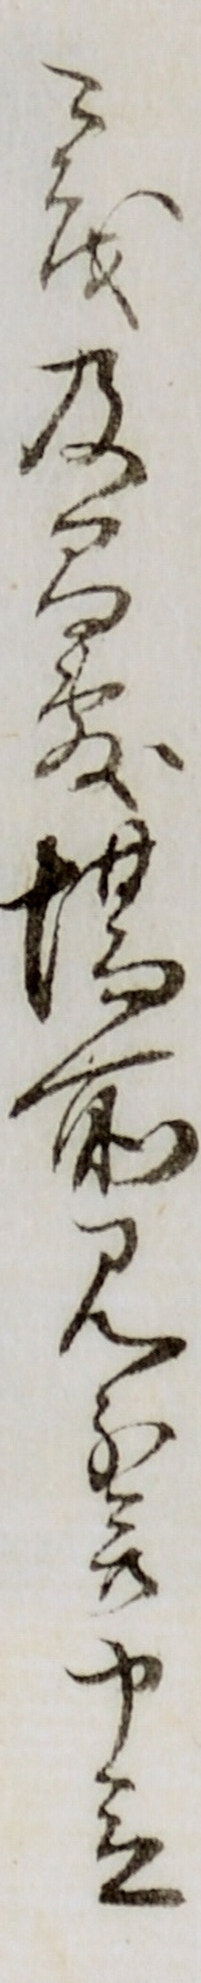にも及間敷場所見分幷申立
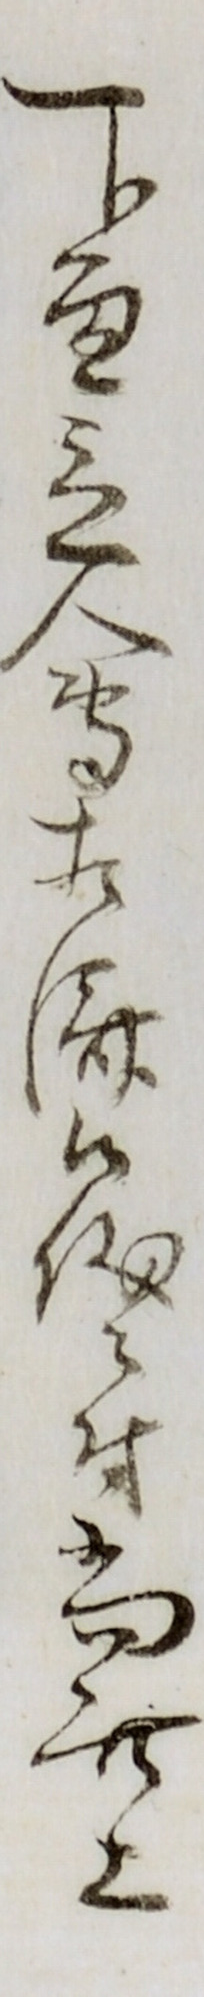下通立会相済候儀に付尚此上
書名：山林方諸事御用留
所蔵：伊那市立高遠町図書館・合同会社AMANE
